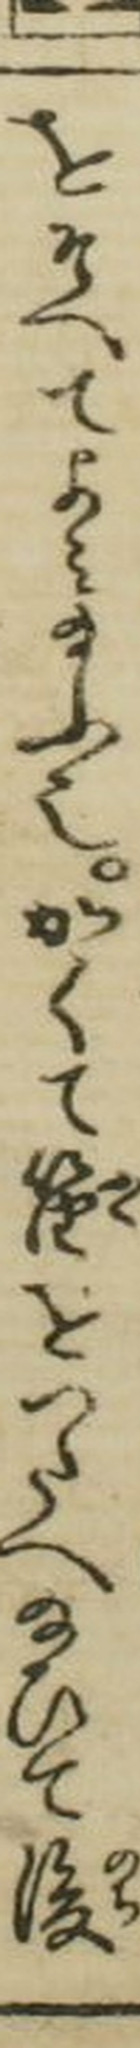をそへてよみ給ふ也。かくて笛をつたへ給ひて後
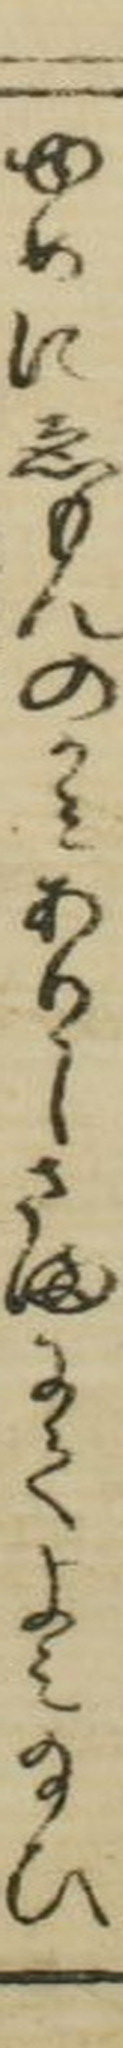ゆめにゑもんのかみありしさまにてよみ給ひ
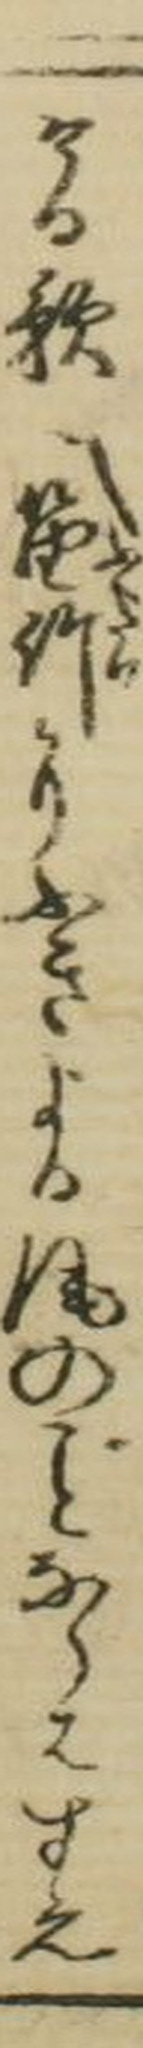ける歌〽笛竹にふきよる風のごとならはすえ
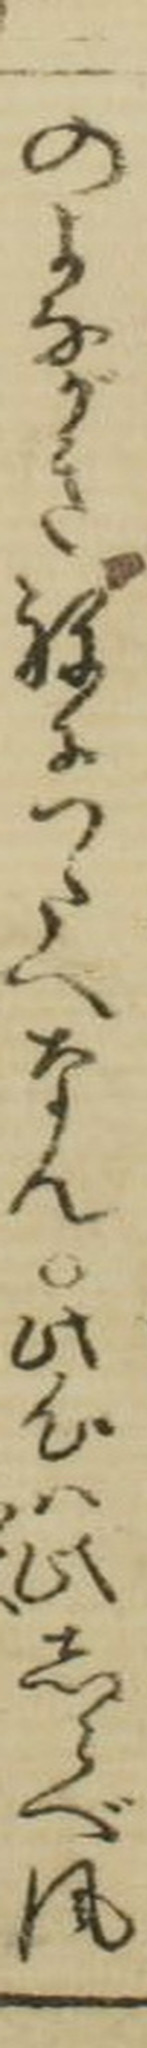のよながきねにつたへなん◯此心はしらべ風
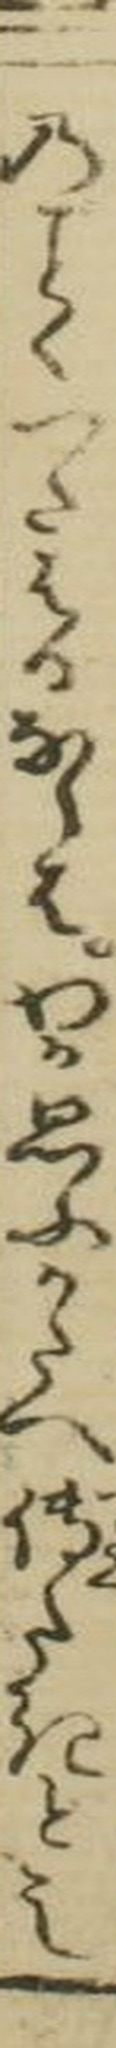のことくつたはるならは。わか思ふかたへ伝たきと也
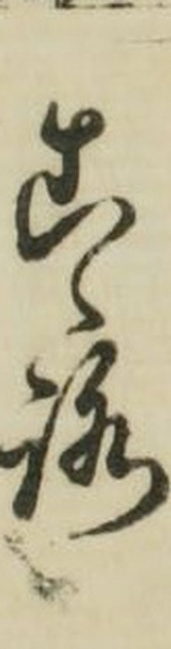こゝろ
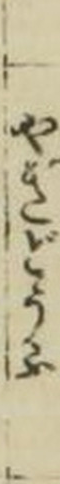やきどうふ
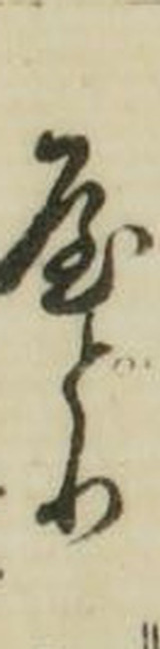やどり
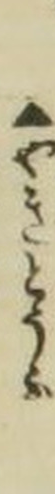やきどうふ
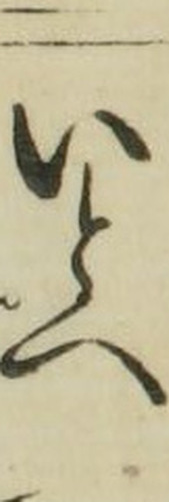いとへ

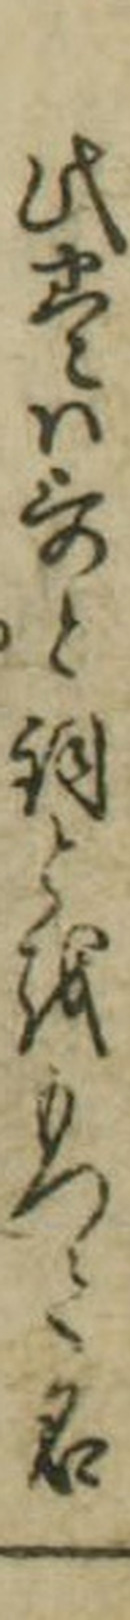此巻は哥と詞とをもつて名
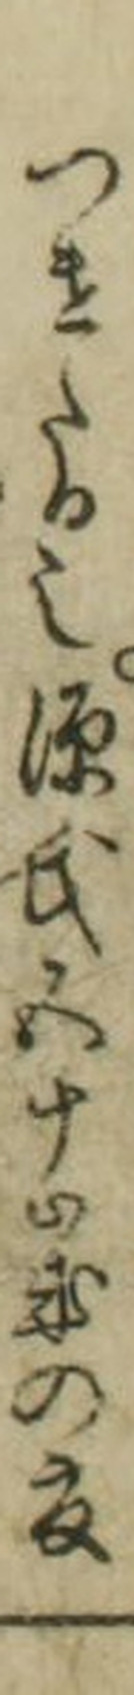つけたる也。源氏五十歳の夏
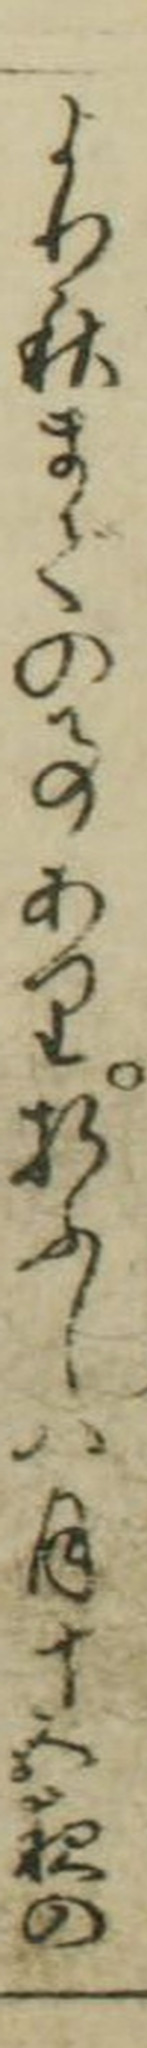より秋までの事あり。折ふし八月十五夜の
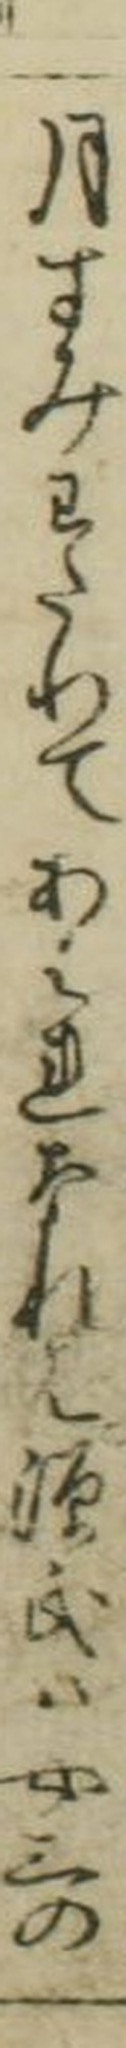月すみわたりてあはれなれは。源氏は女三の
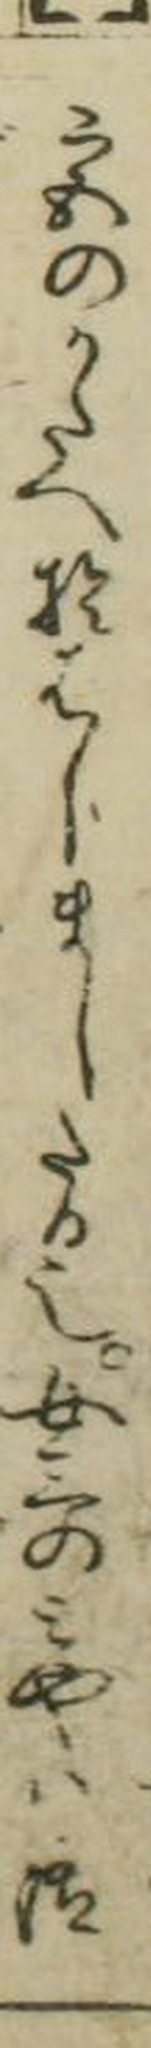宮のかたへおはしましたる也。女三のみやは御
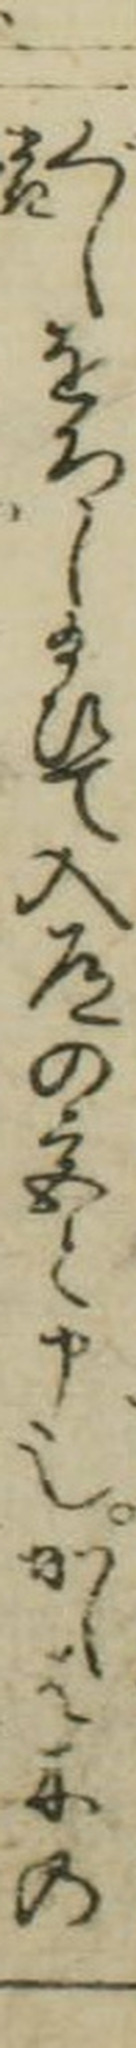ぐしをろし給ひて入道の宮と申也。かしは木の
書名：女源氏教訓鑑
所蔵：東京学芸大学附属図書館
